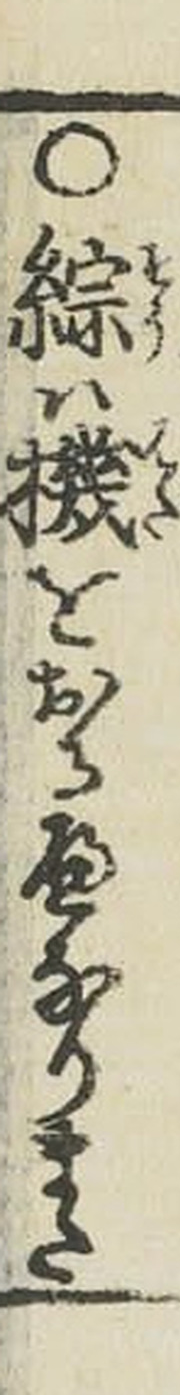○綜は機をおるへなりまた
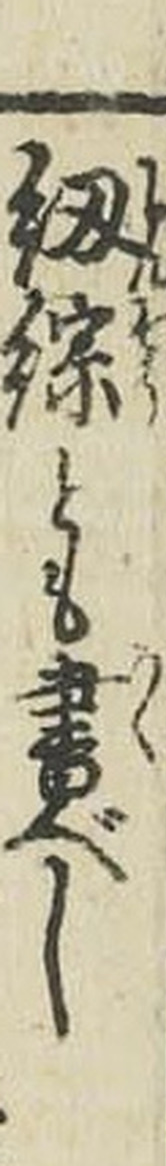紉綜とも書べし
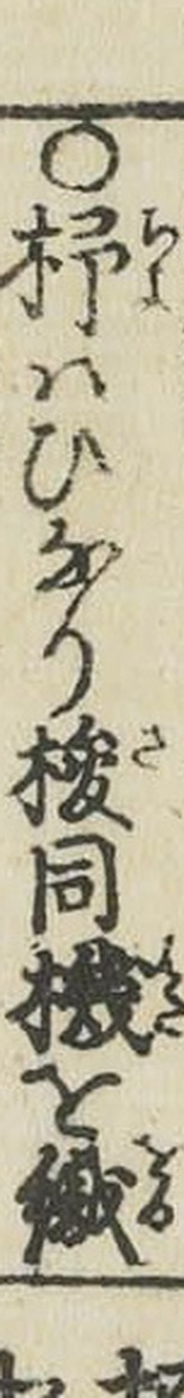○杼はひなり梭同機を織
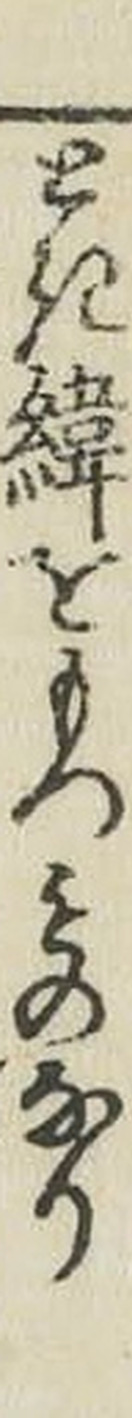とき緯をもつものなり
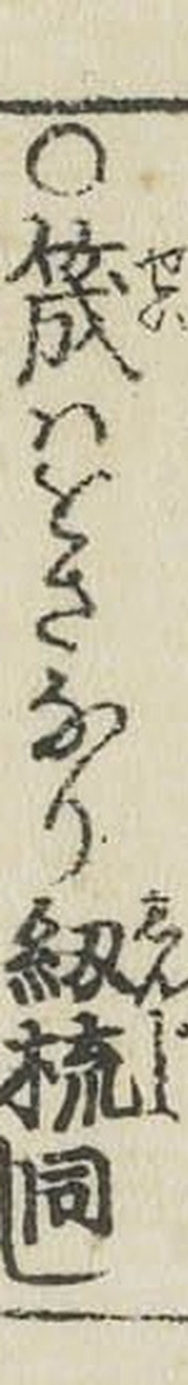○筬はをさなり紉梳同し
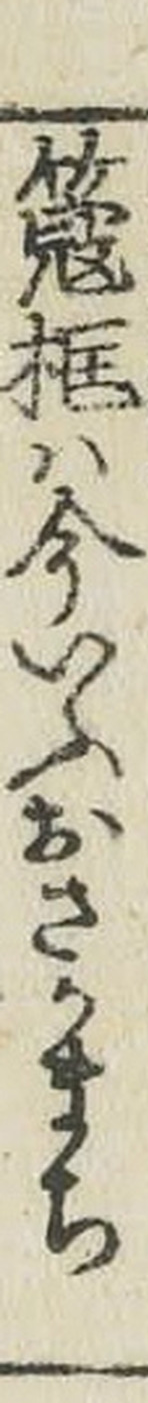簆框は今いふおさかまち
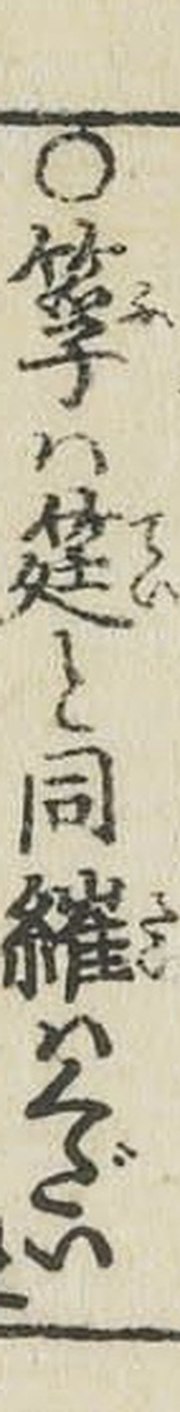○筟は筳と同繀はくだいと
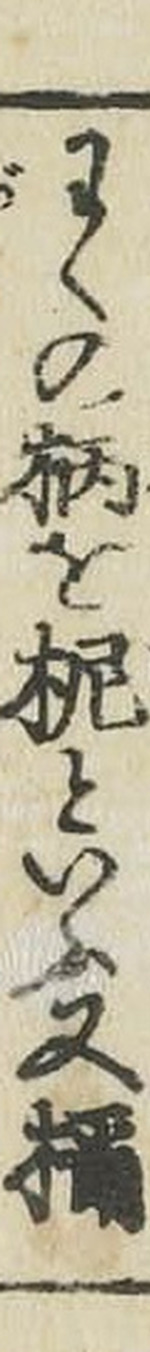わくの柄を柅といふ又檷
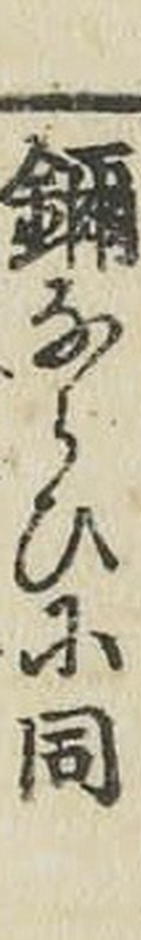鑈ならひに同
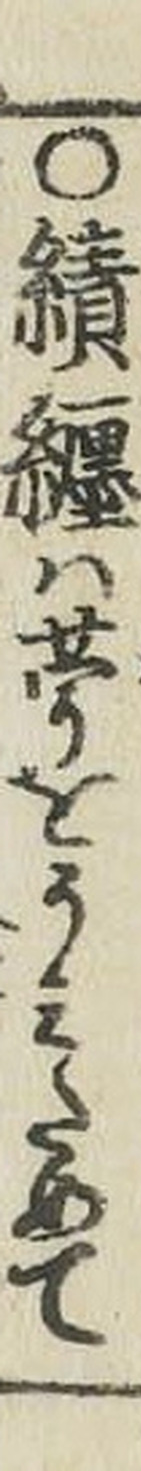○績纏は苧をうみためて
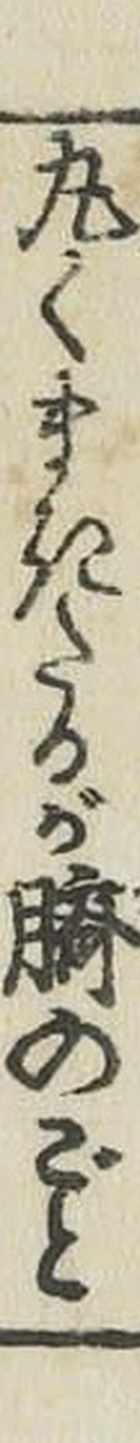丸くまきたるが臍のごと
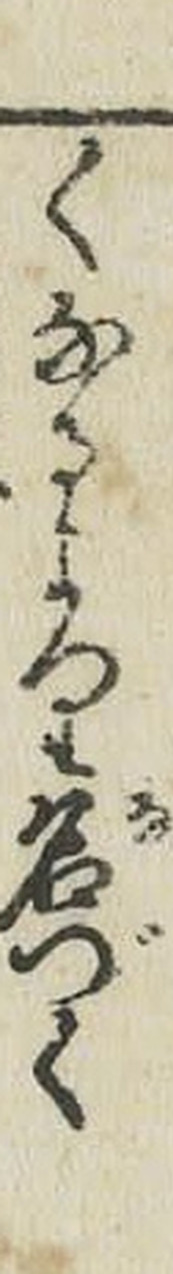くなるより名づく
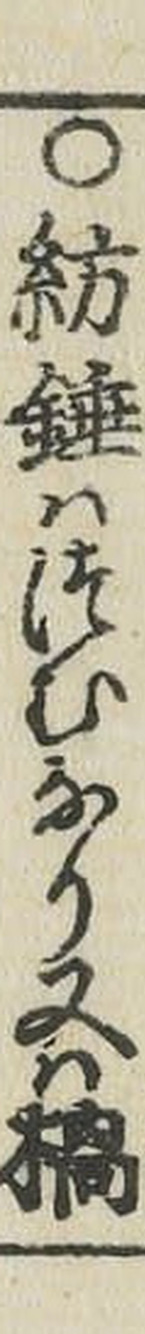○紡錘はつむなり又は楇
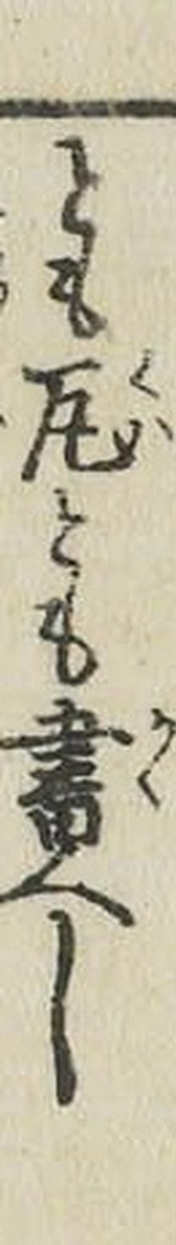とも瓦とも書へし
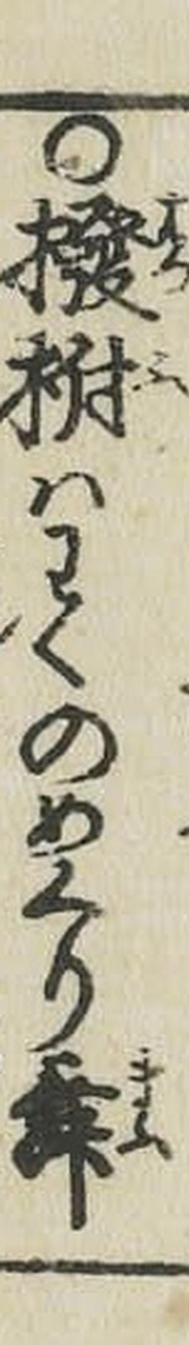○撥柎はわくのめくり舞
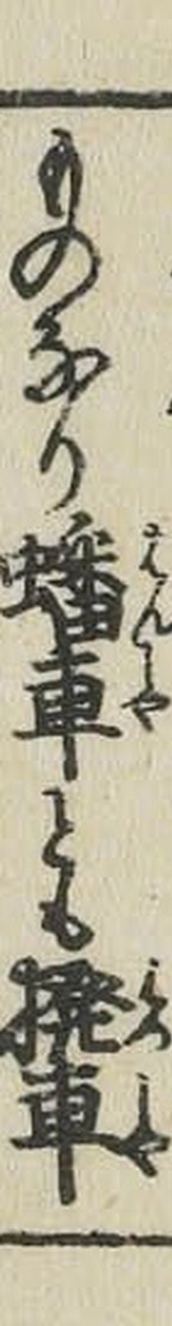ものなり蟠車とも撥車
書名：増補頭書訓蒙図彙大成 10巻 5:巻之9-11
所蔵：東京学芸大学教育コンテンツアーカイブ
